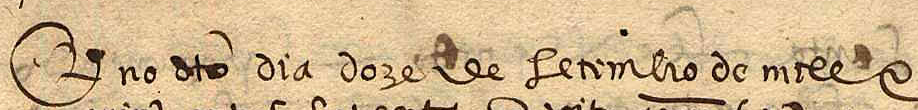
E no dtō dia doze de setembro de mill e
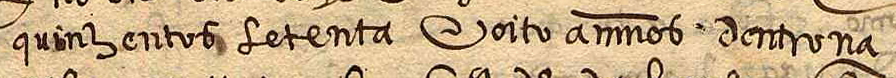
quinhentos setenta e oito an̄nos dentro na
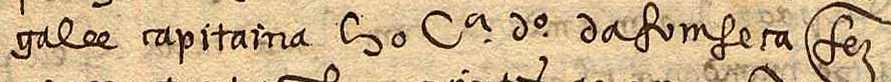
galee capitaina ho Cor. do. da fomseca fez
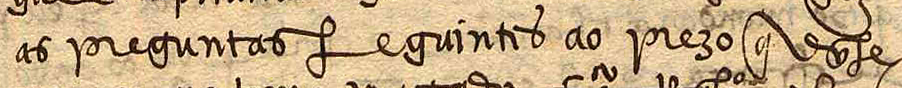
as preguntas seguintes ao prezo q̄ dyse
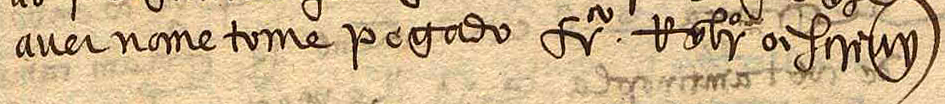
auer nome tome pegado frco. Rybro o escreuy
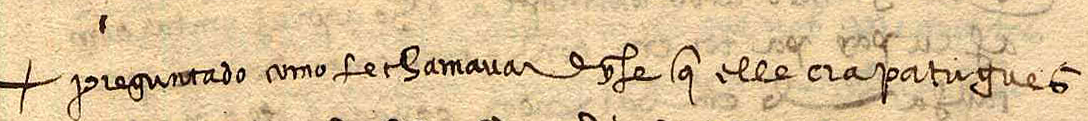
+ preguntado como se chamaua dyse q̄ elle era portugues
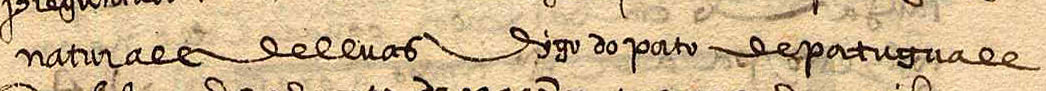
naturall delluas dygo do porto de portuguall
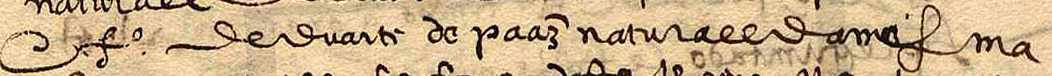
e fo. de duarte de paaz̄ naturall da mesma
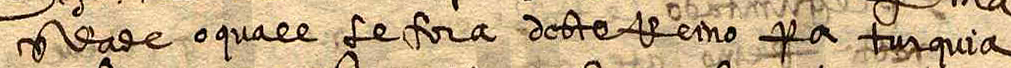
cydade o quall se fora deste Reino ꝑa turquia
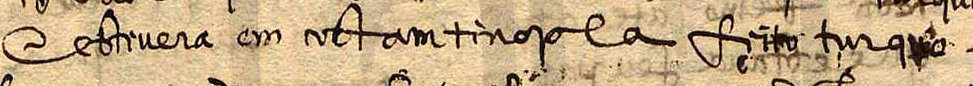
e estiuera em costamtinopla feito turquo
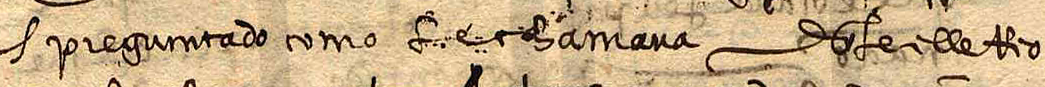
+ pregumtado como se e chamaua dyse elle Reo
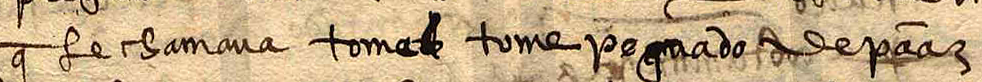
q̄ se chamaua tomas tome peguado de pāaz
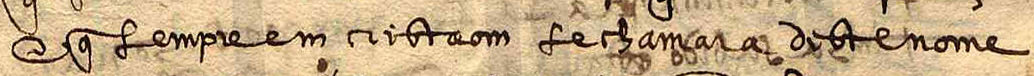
e q̄ sempre em cristaom se chamara deste nome
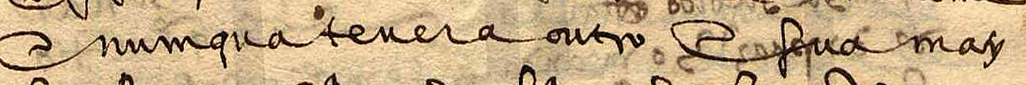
e numqua teuera outro e sua may
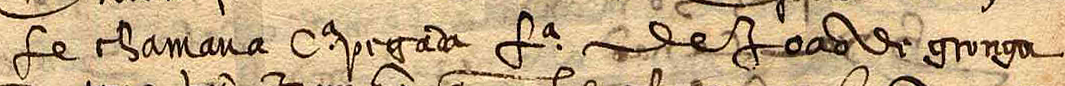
se chamaua Ca. pegada fa. de Joaõ de gronga
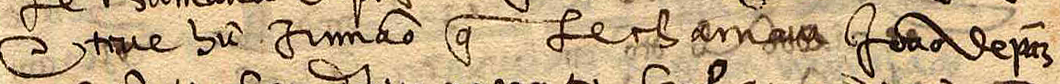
e teue hū Jrmão q̄ se chamaua João de pāz
